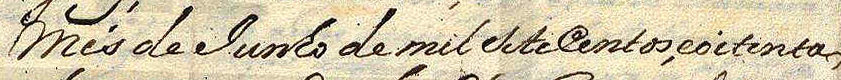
Més de Iunho de mil seteCentos, e oitenta
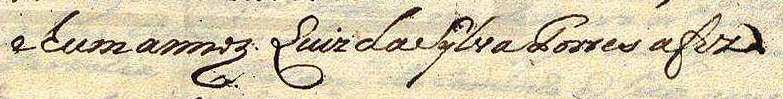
e hum annoz Luiz da Sylva Torres a fiz
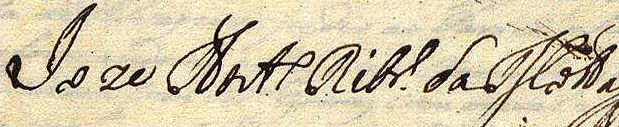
Ioze Ant.o Ribr.o da Motta
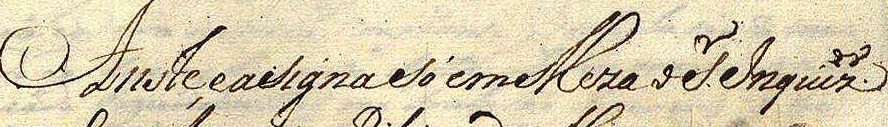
Asiste e asigna só em Meza o S.r Inquiz.or
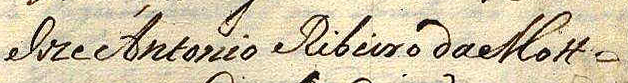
Ioze Antonio Ribeiro da Mott
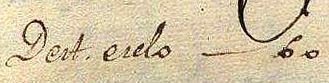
Dest. e selo 60
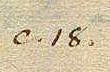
c.18.
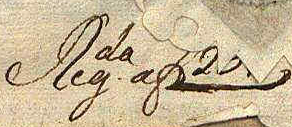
Reg.da a fl 20
